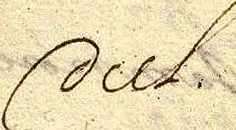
decl.
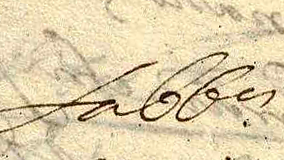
sabb.os
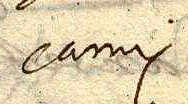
camis
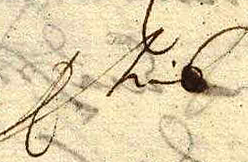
ꝓhib
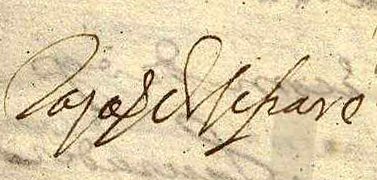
Razaõ de se fiarē.
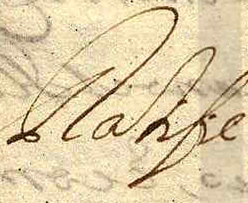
Ratific
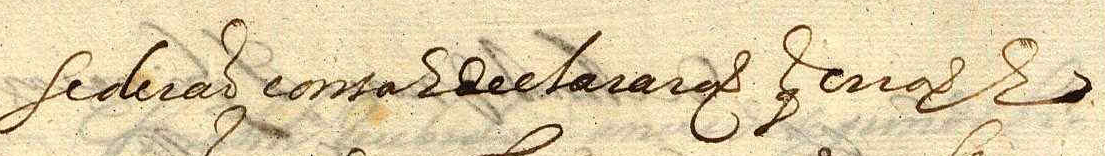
se deraõ conta E declararaõ q̄ criaõ E
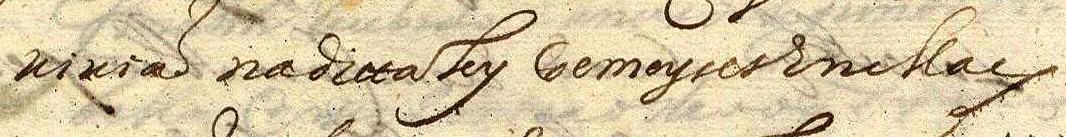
uiuiaõ na ditta ley de moyses E nella es
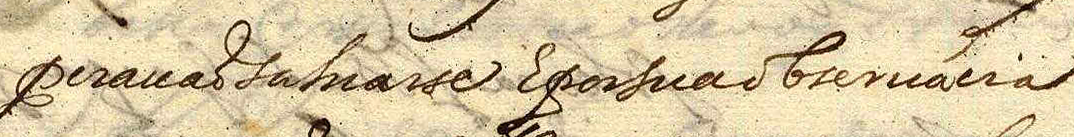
perauaõ saluarse E por sua obseruācia
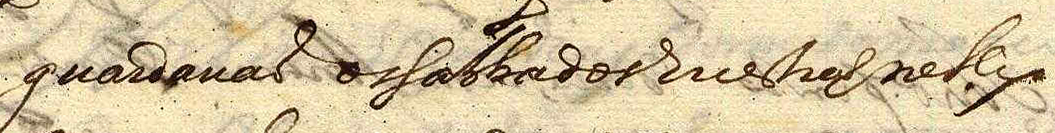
guardauaõ os sabbados E uestiaõ nelles
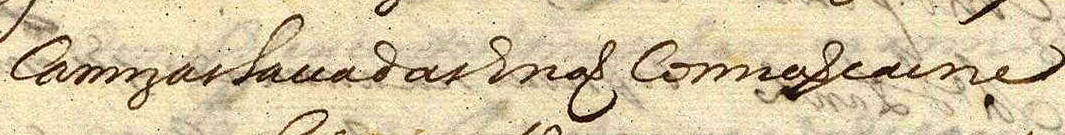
camizas lauadas E naõ comiaõ carne
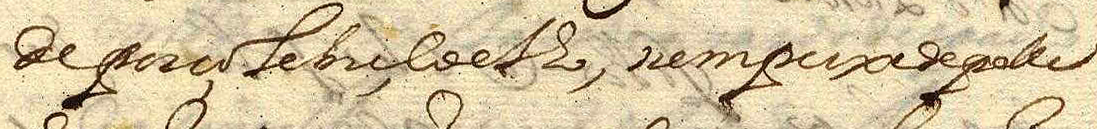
de porco lebre, coelho, nem peixe de pelle
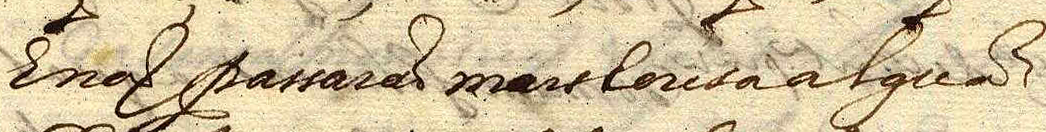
E naõ passaraõ mais cousa alguā
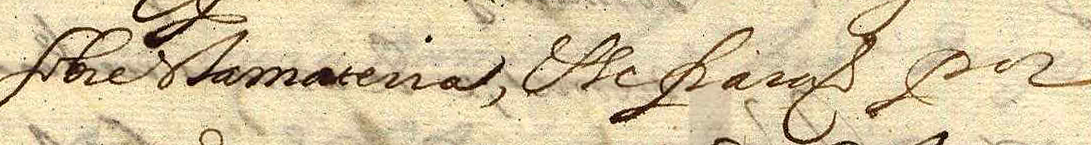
sobre esta materia, & se fiaraõ por
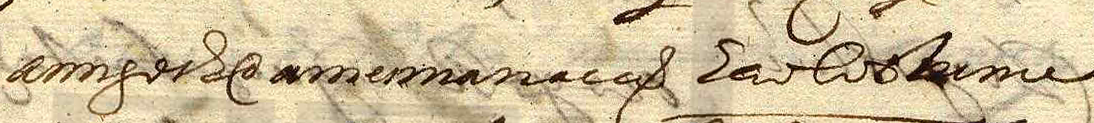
amigos E da mesma naçaõ E ao costume
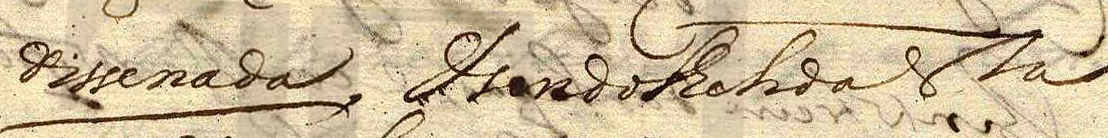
disse nada, & sendolhe lida esta
